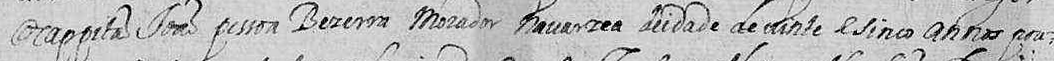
O cappitaõ Ioaõ pessoa Bezerra morador na uarzea de idade de uinte e sinco annos pou
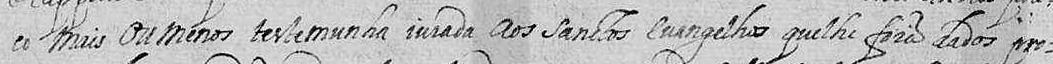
co mais ou menos testemunha iurada aos sanctos euangelhos que lhe foraõ dados pro
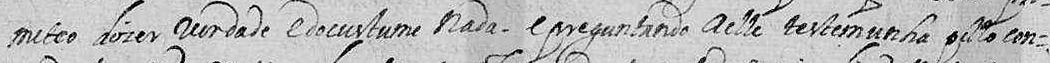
meteo dizer uerdade e do custume nada. e preguntando a elle testemunha pello con
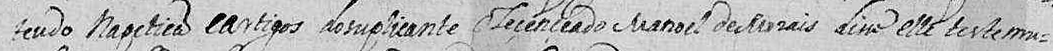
teudo na petiçaõ e artigos do suplicante o Lecenceado Manoel de Morais disse elle testemu
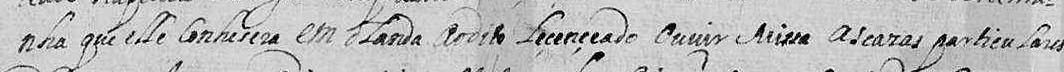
nha que elle conhecera em olanda ao dito Lecenceado ouuir Missa as cazas particulares
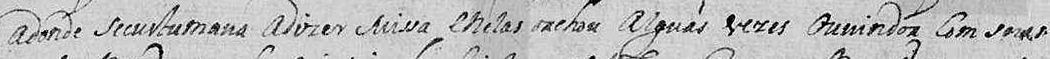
adonde se custumaua a dizer Missa e nelas o achou alguãs vezes ouuindoa Com suas
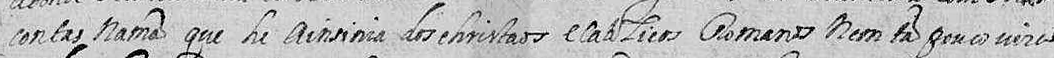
contas na maõ que he a insinia dos christaos e catolicos Romanos nem tã pouco uira
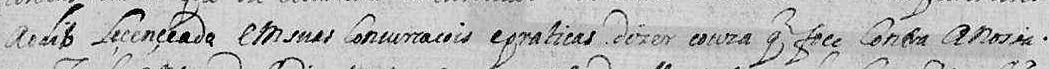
ao dito Lecenceado em suas conuerçaçois e praticas dizer couza q̄ foce contra a nossa
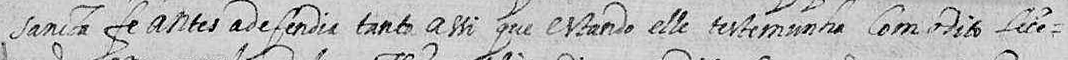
sancta fe antes a defendia tanto assi que estando elle testemunha com o dito Lecē
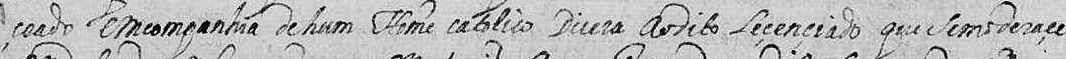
ceado em companhia de hum Homē catolico Dicera ao dito Lecenciado que se moderace
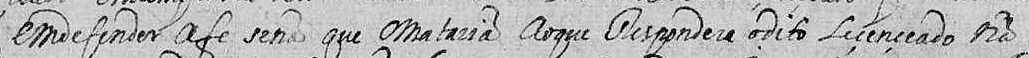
em defender a fe senaõ que o matariaõ ao que Respondera o dito Lecenceado nã
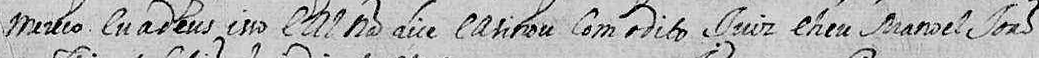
mereço eu a deus isso E al nã dice e asinou com o dito Iuiz e heu Manoel Ioaõ
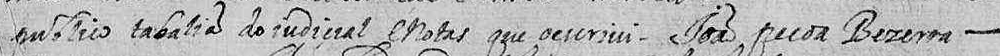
publico tabaliaõ do iudicial e notas que o escriui. Ioaõ peçoa Bezerra -
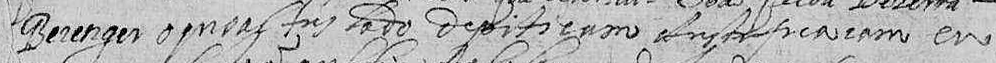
Berenger o qual treslado de pitiçam e Iustificacam eu
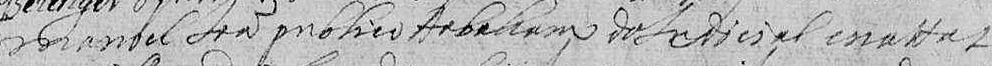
manoel Ioaõ publico tabaliam do Iudicial e nottas
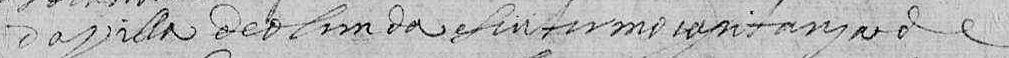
da villa de olinda e seu termo capitanja de
